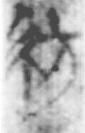紡
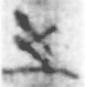之
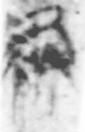綳
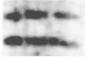二
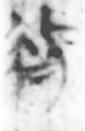紫
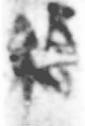○（組）
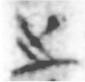之
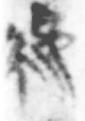綏
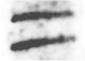二
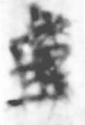○（纁）
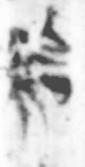○（組）
